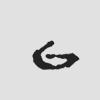㠯（以）
